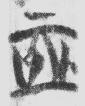亟
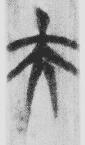夫
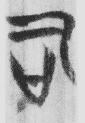司
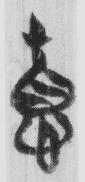惪
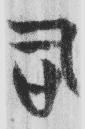司
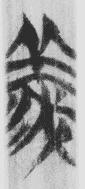義
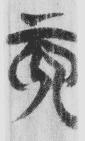而
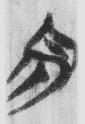易
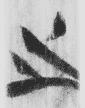之
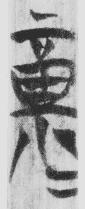福=
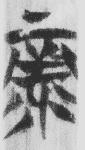彔
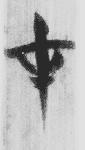才
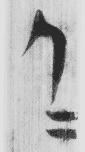人=
